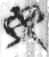𡚦
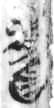壽
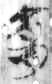宜
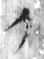人
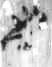民
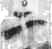土
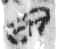田
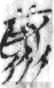聚（驟）
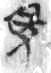○（得）
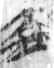盍（蓋）
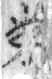東
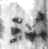之
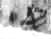遇（寓）
